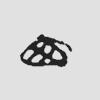西
